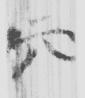亓
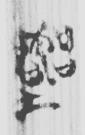{器土}
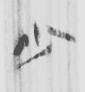少
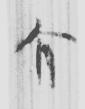大
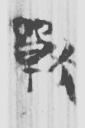{單犬}
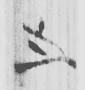之
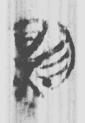則
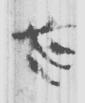必
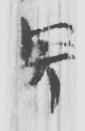長
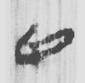㠯（以）
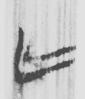亡
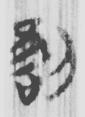割
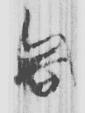{㠯ㅋ}
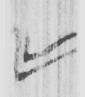亡
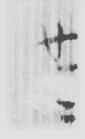{廿亖}
